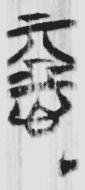惡
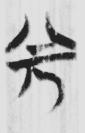{八万}
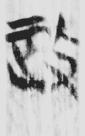政
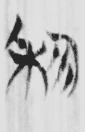利
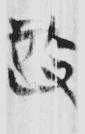政
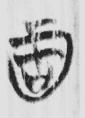固
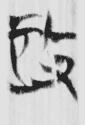政
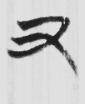又
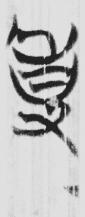事
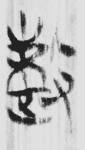整
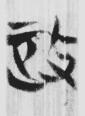政
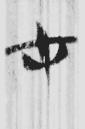才
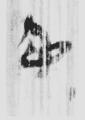身
